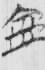金
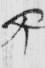不
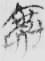賽
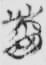○（廩）
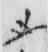之
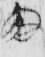客
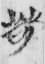苛
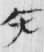內
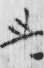之
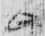白
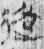○（路）
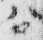公
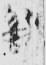○（慎）
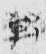登
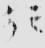行
